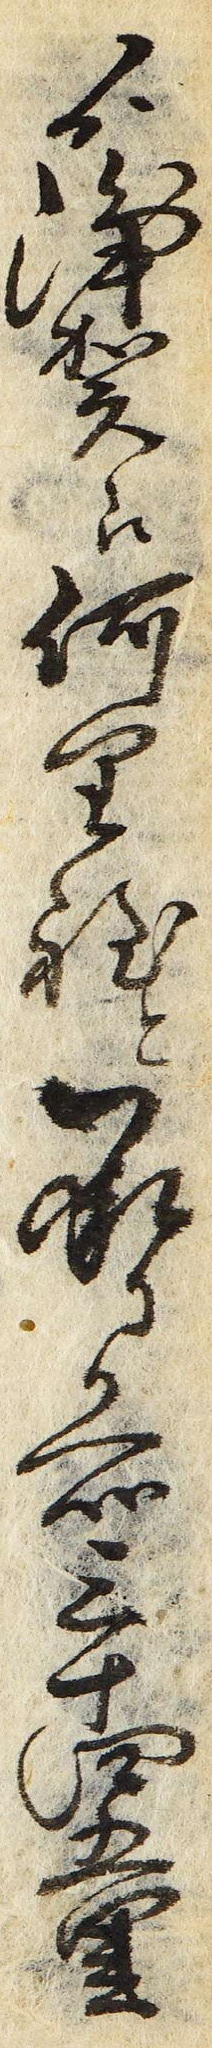ゟ浦賀え何里程と承り候所三十四五里
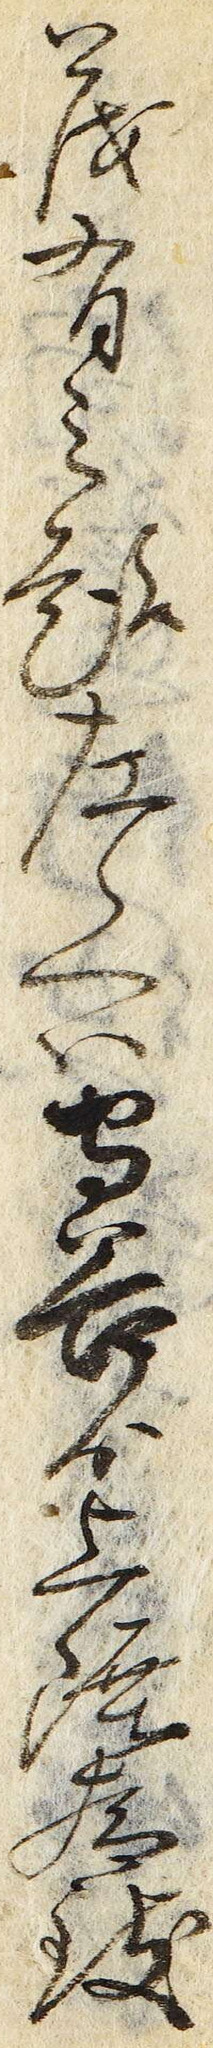も有之趣左候ヘハ守谷ゟ上陸為致
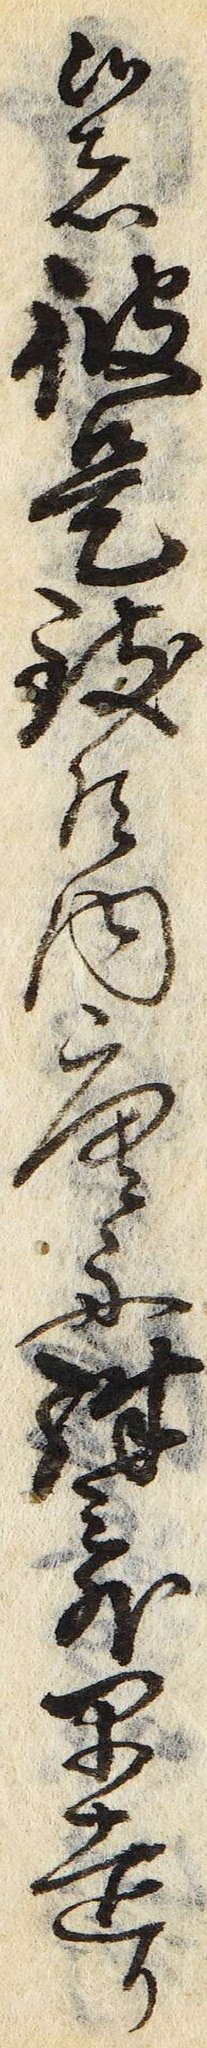候者彼是致候内唐舟殊之外早走り
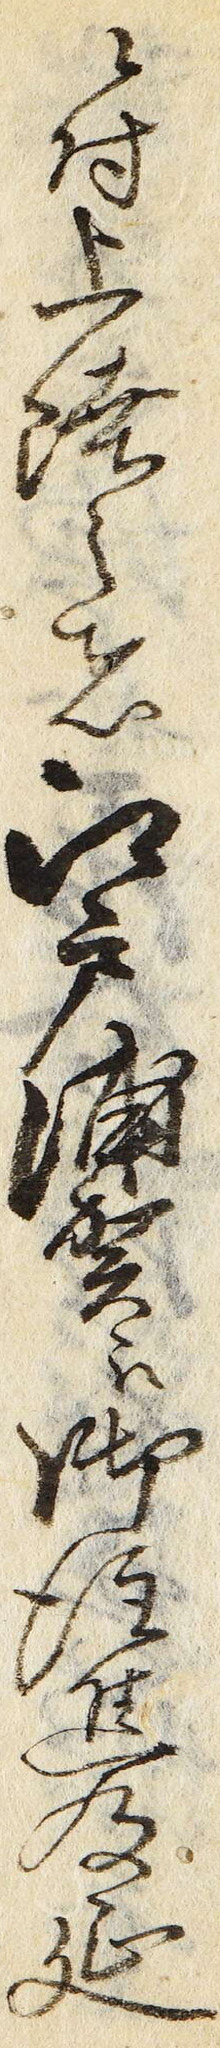ニ付上陸之者江戸浦賀え御注進及延
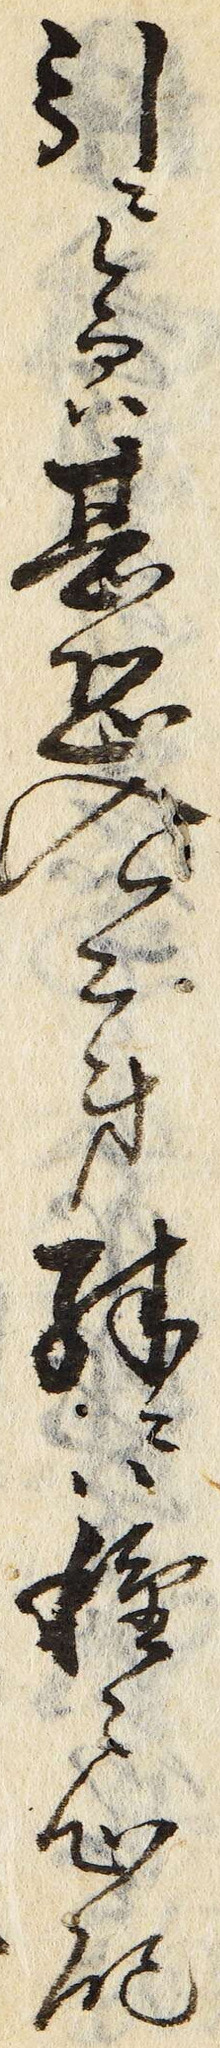引ニ候而ハ甚恐入候殊ニハ種々心配
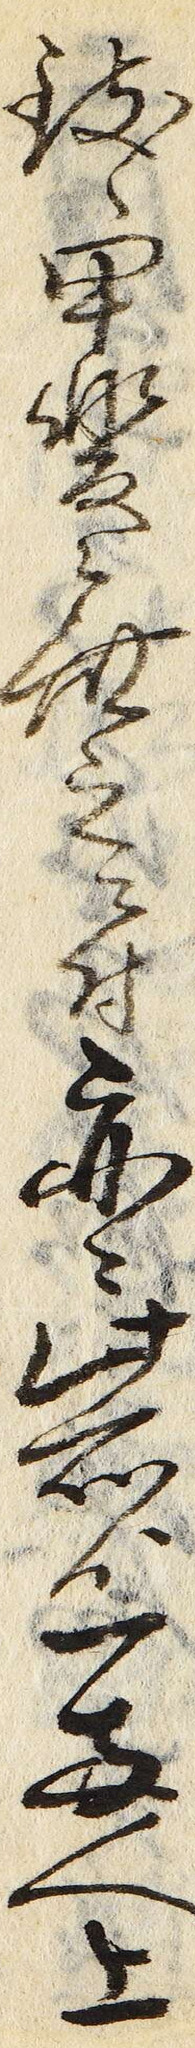致候甲斐無之ニ付亦々此所ゟ一両人上
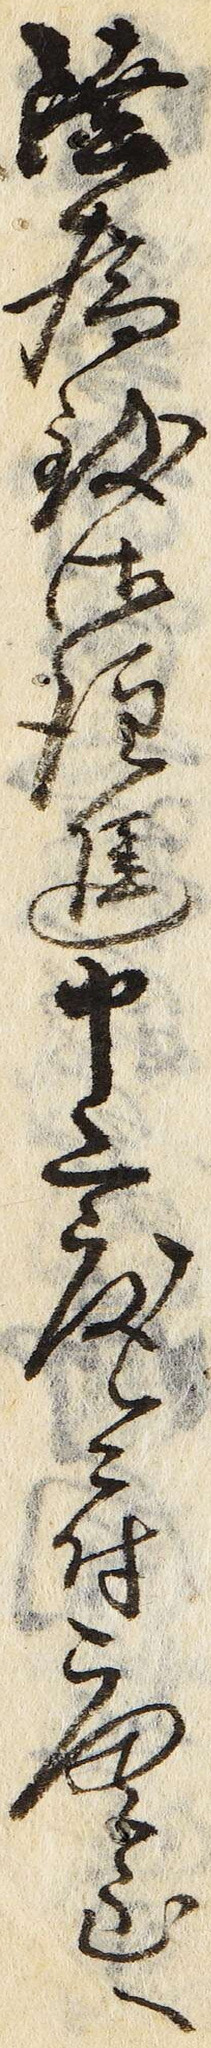陸為致御注進申上度候ニ付唐へ
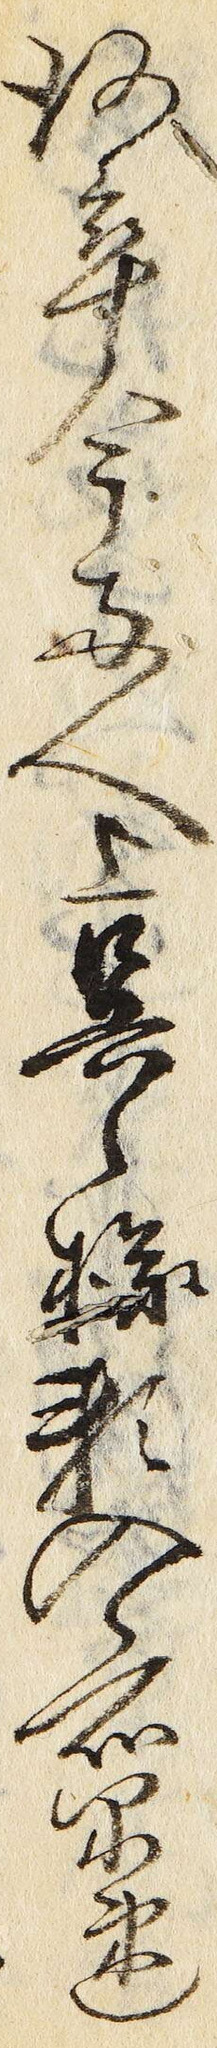何卒今両人上呉候様頼入候所早速
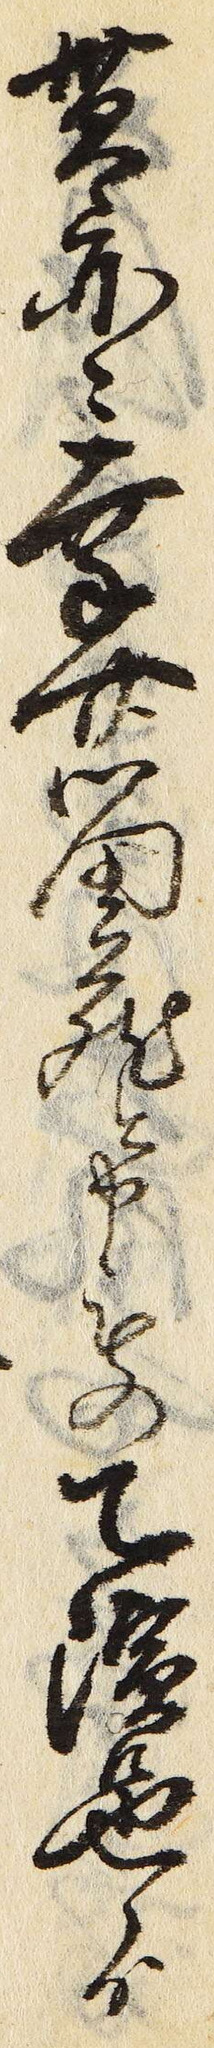貰亦々幸介留蔵と申もの乙浜邑ゟ
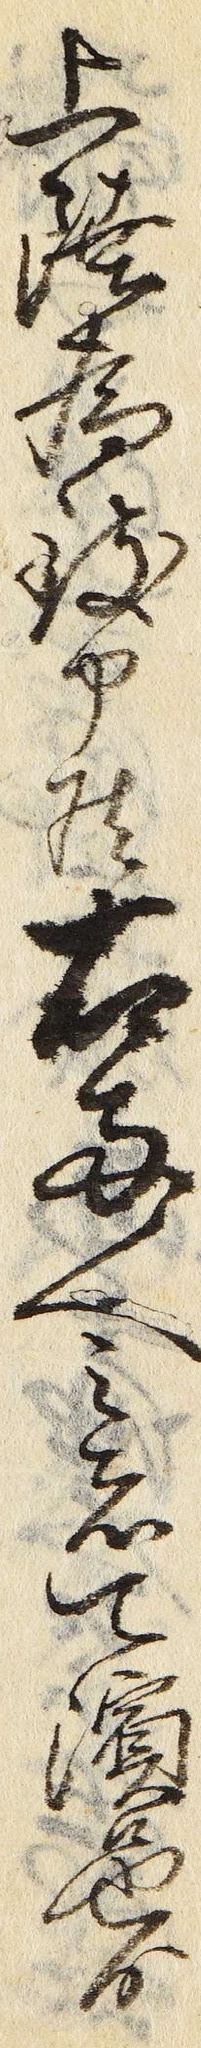上陸為致申候右両人之者乙浜邑ゟ
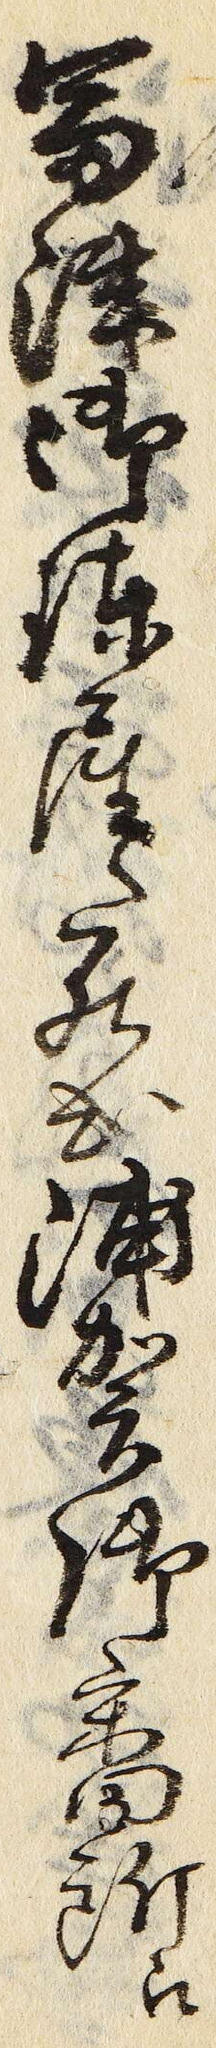冨津御陣屋へ罷出浦賀御番所え
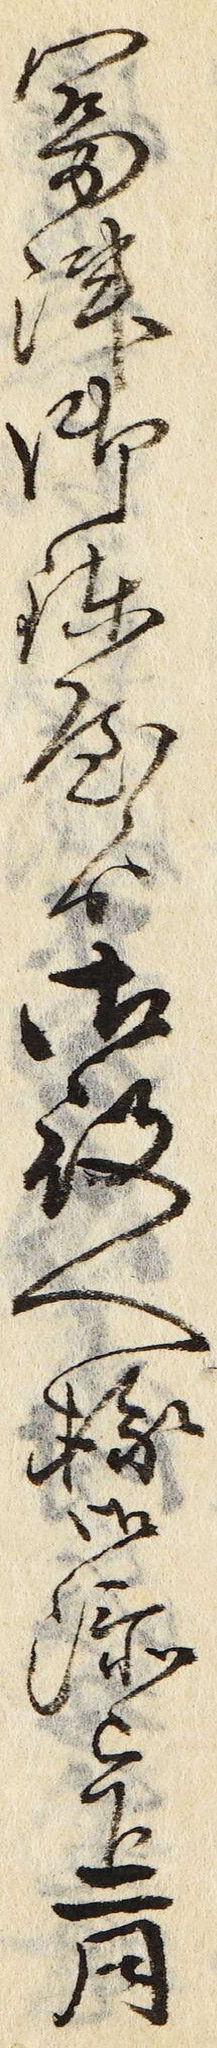冨津御陣屋ゟ御役人様御添被下二月
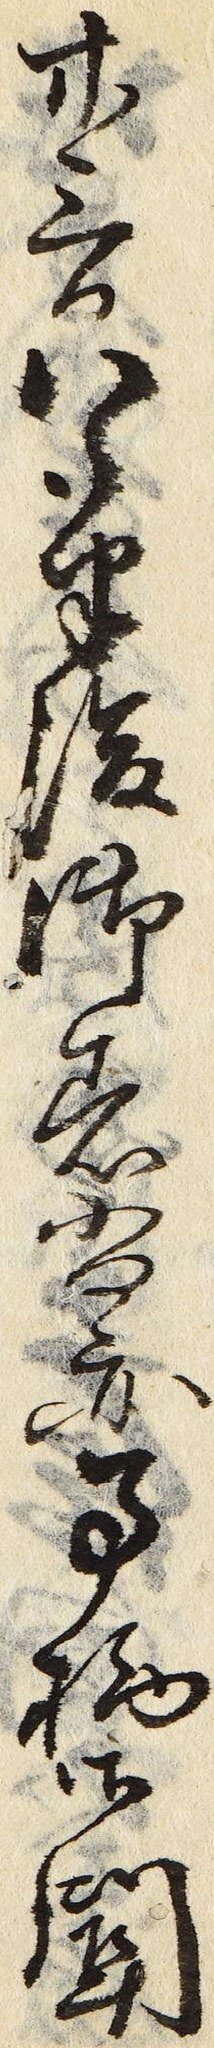廿三日八ツ半後御着尚亦事柄御聞
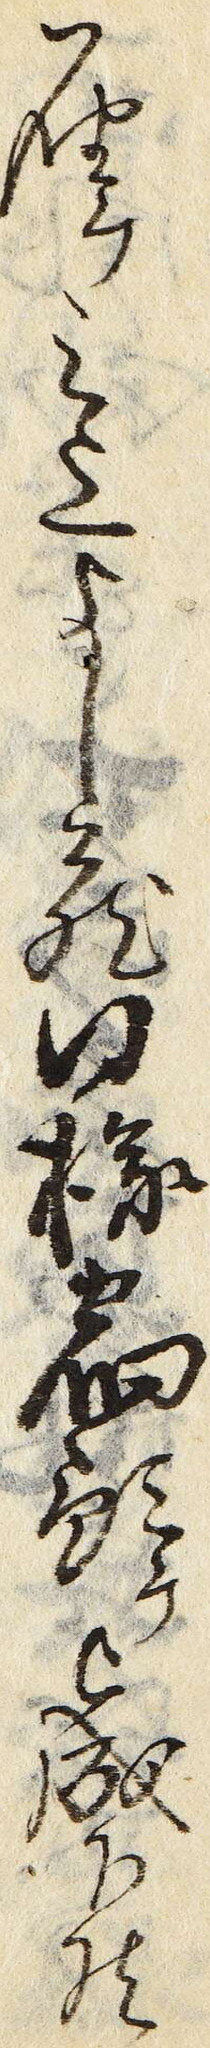届ケ之上よし蔵同様宿預ケ被成下候
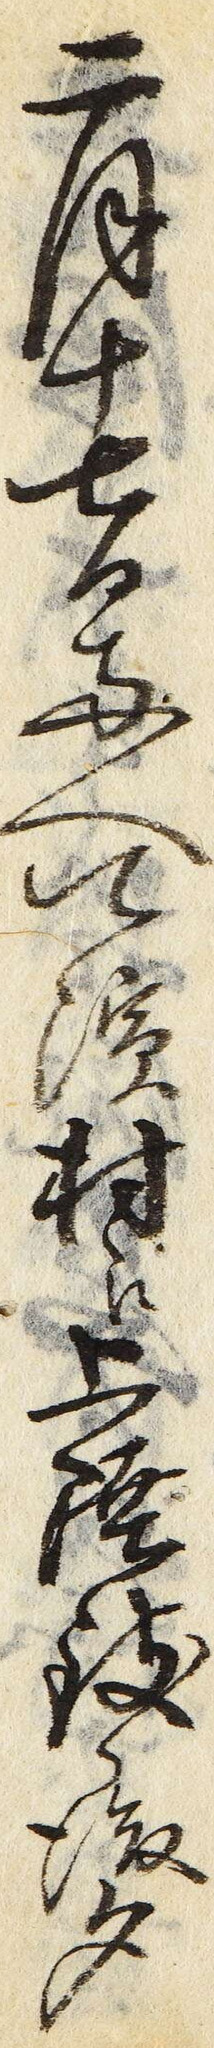二月十七日両人乙浜村え上陸致候後夕
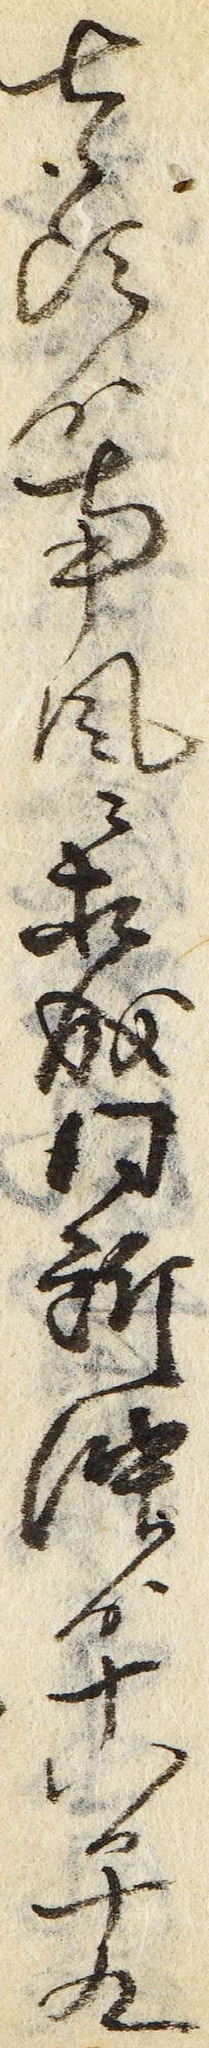七ツ頃ゟ南風ニ相成同所沖ゟ十八日十九
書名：阿波幸宝丸漂流記
